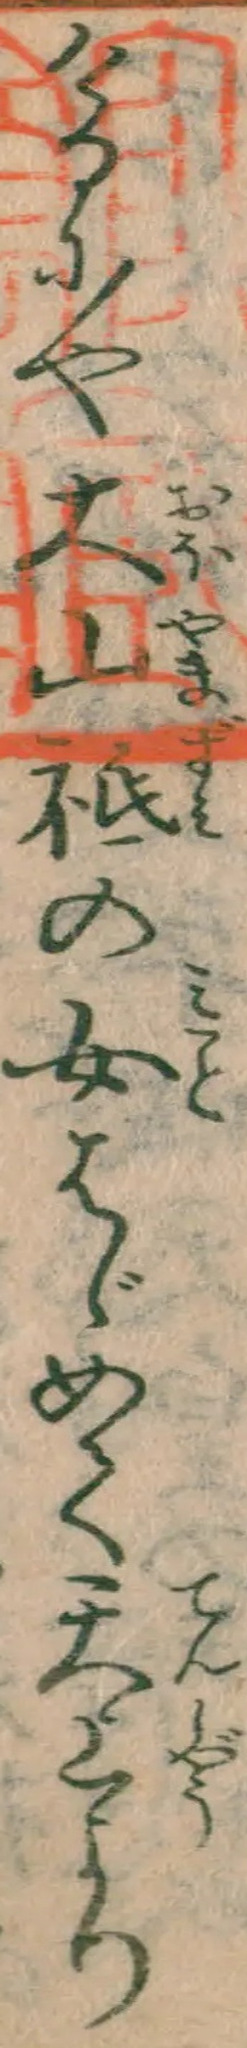けるにや大山祗の女はじめて天上より
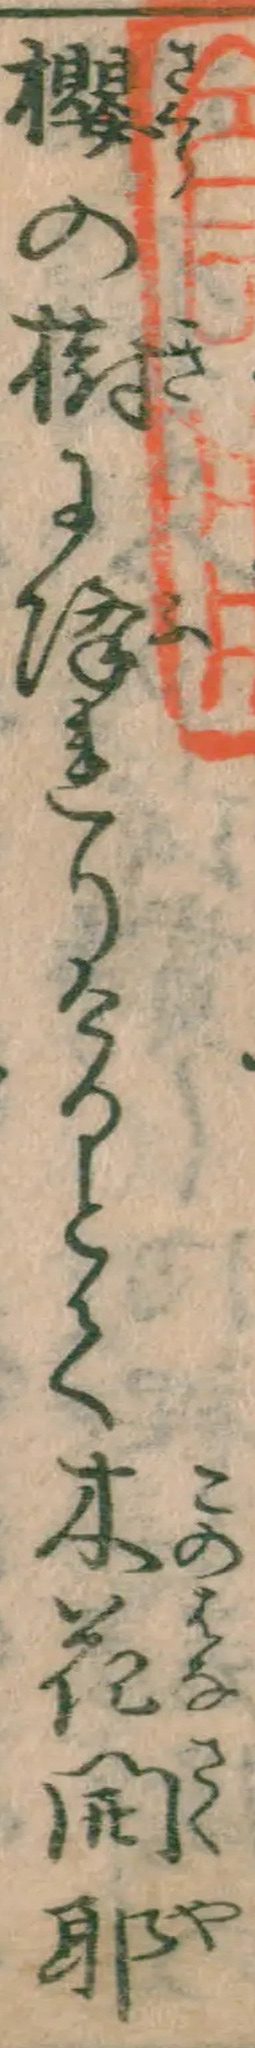桜の樹に降れりけるとて木花開耶
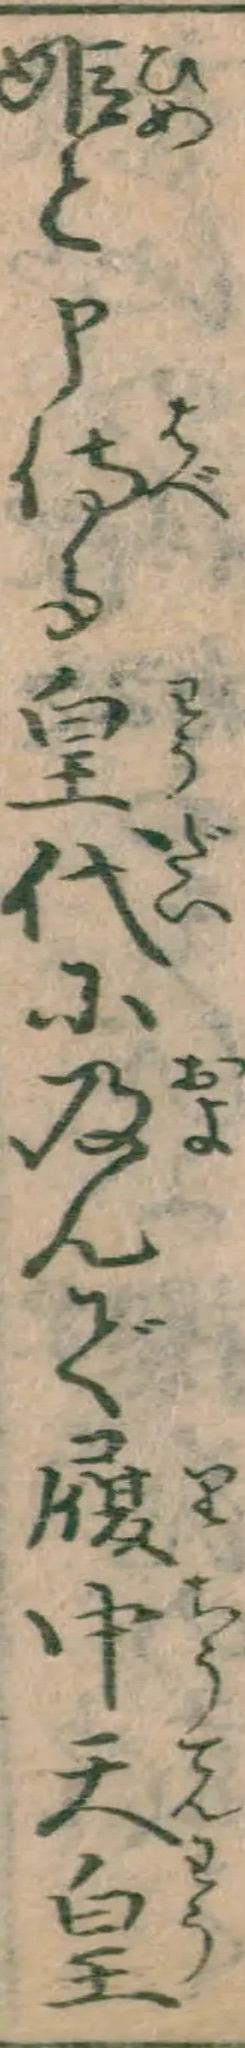姫と申侍る皇代に及んで履中天皇

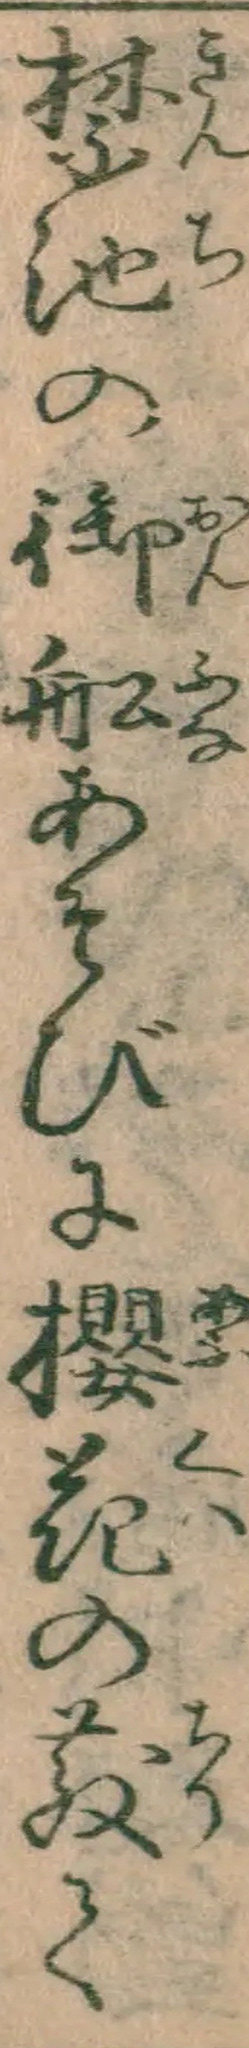禁池の御船あそびに桜花の散て
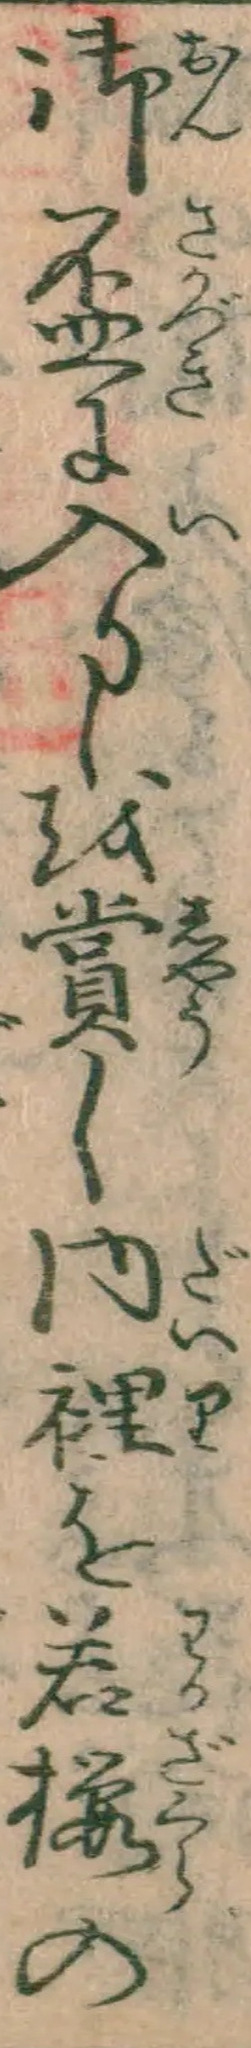御盃に入りしを賞し内裡を若桜の
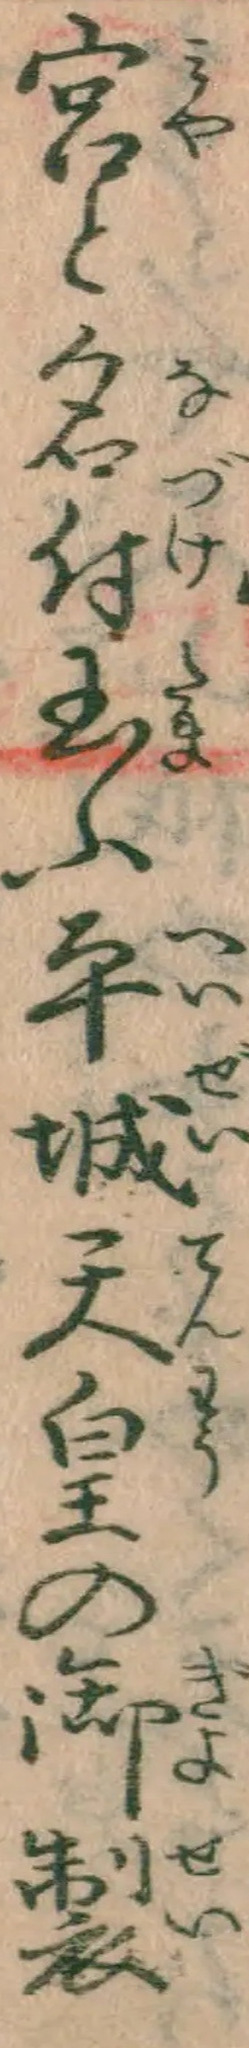宮と名付玉ふ平城天皇の御製
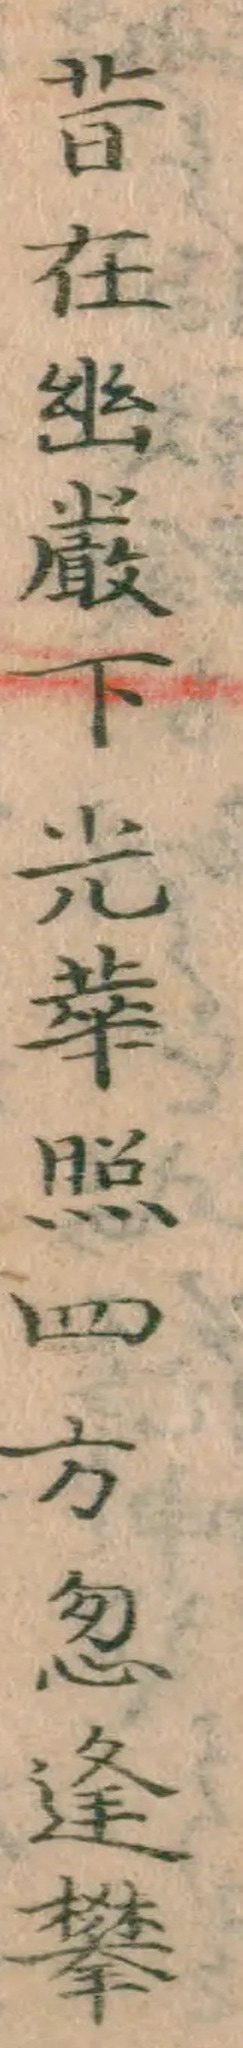昔在幽厳下光華照四方忽逢攀
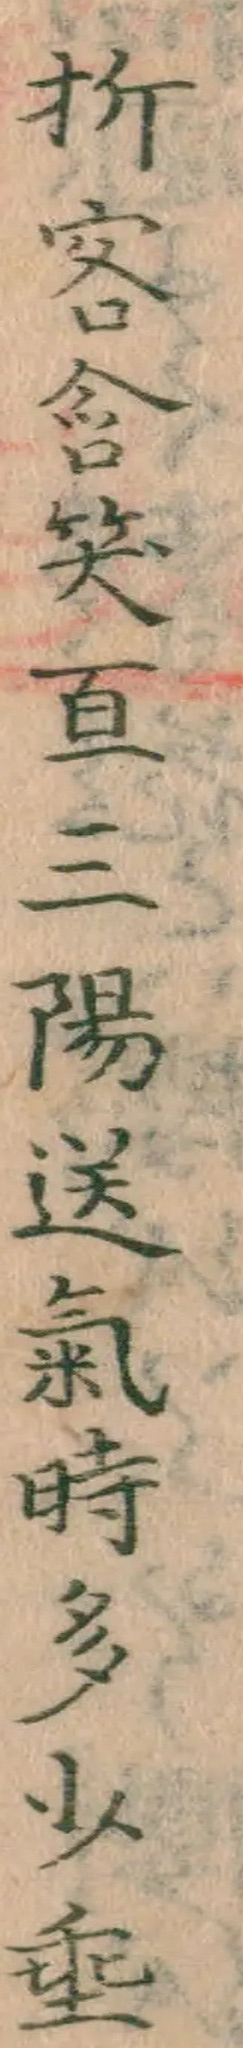折客含笑亘三陽送気時多少垂
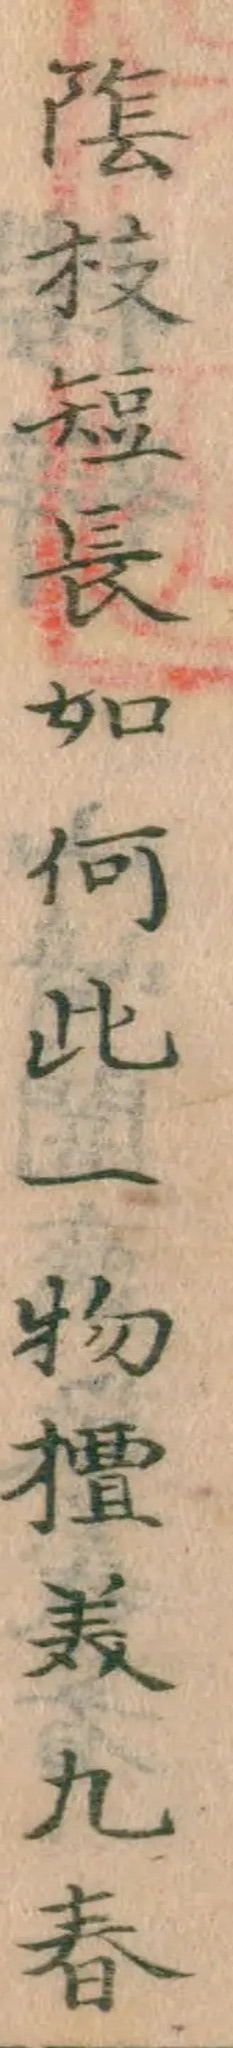陰枝短長如何此一物擅美九春
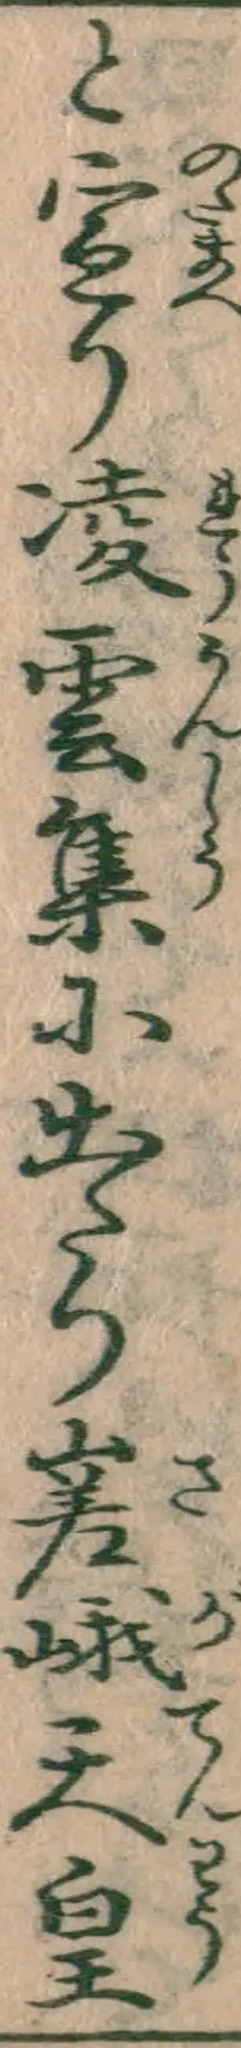と宣り凌雲集に出たり嵯峨天皇
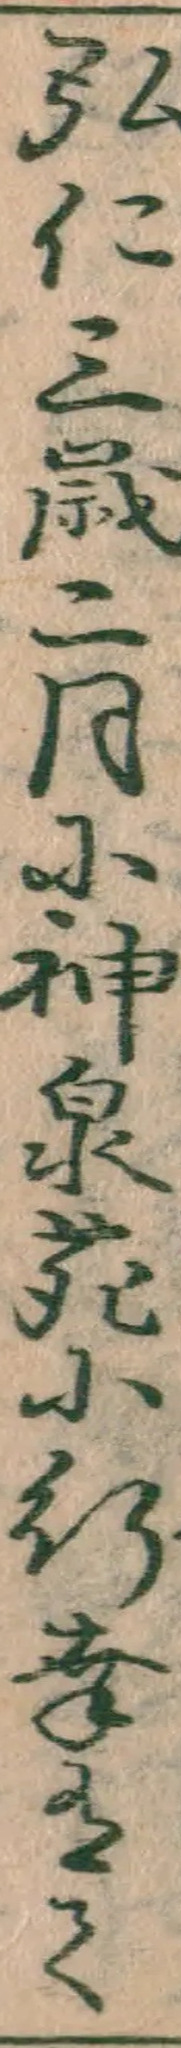弘仁三歳二月に神泉苑に行幸有て
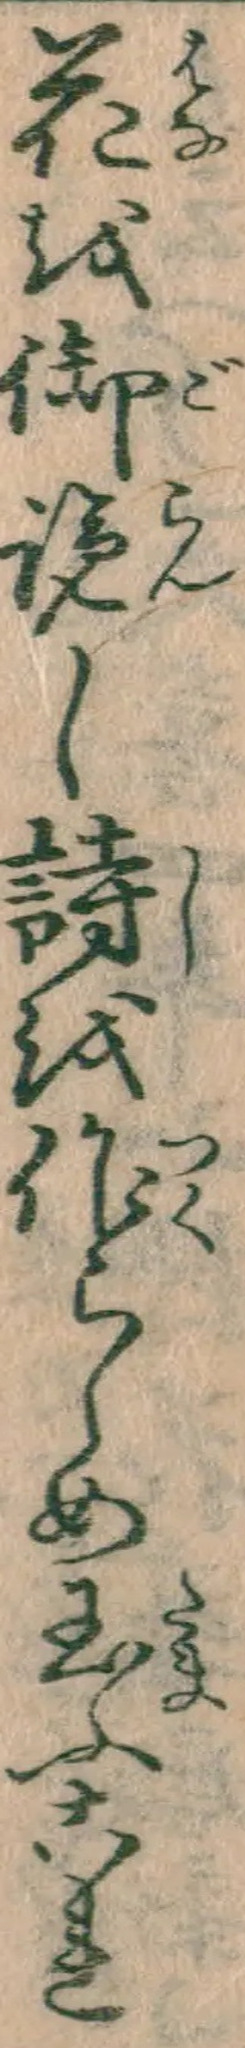花を御覧し詩を作らしめ玉ふこれ
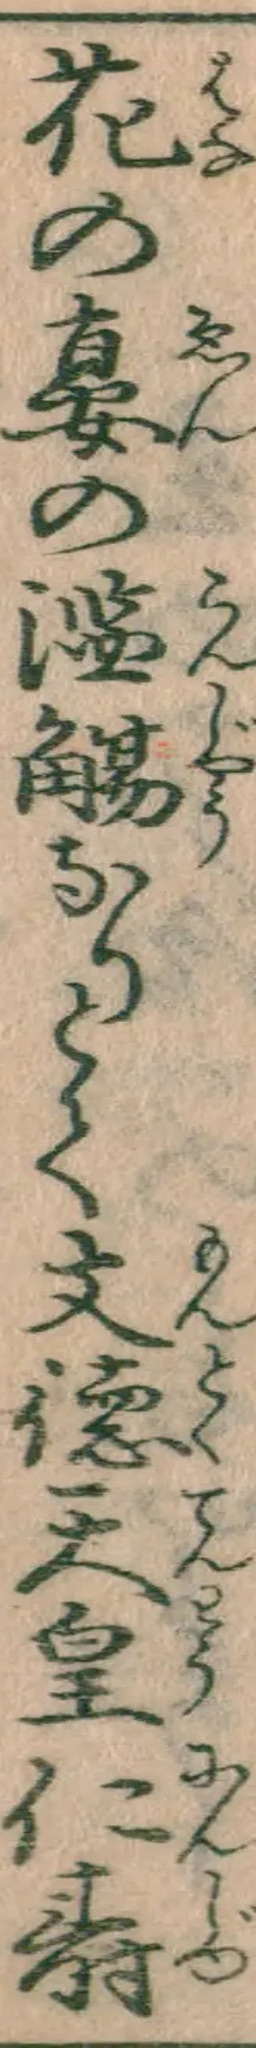花の宴の濫觴なりとて文徳天皇仁寿
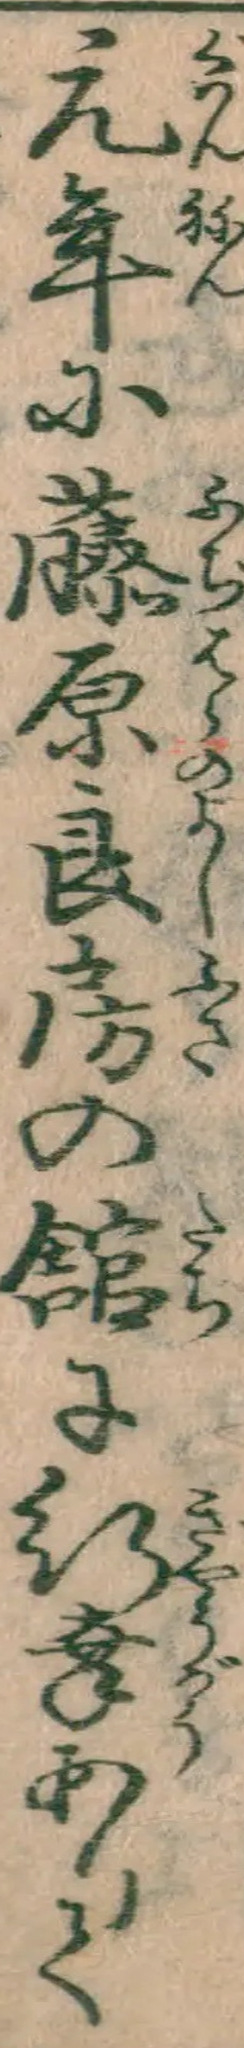元年に藤原良房の舘に行幸ありて
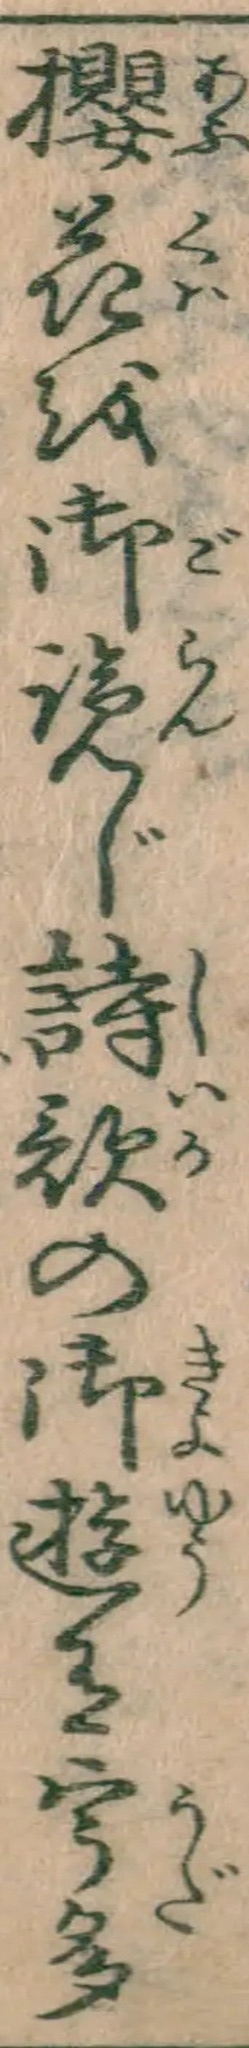桜花を御覧じ詩歌の御遊有宇多
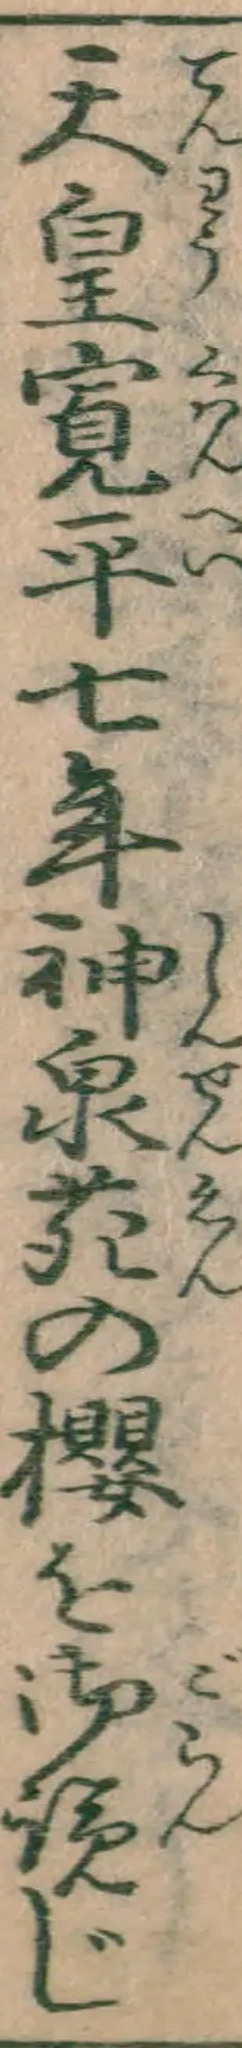天皇寛平七年神泉苑の桜を御覧じ
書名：怡顔齋櫻品
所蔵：国立国会図書館 National Diet Library, JAPAN
